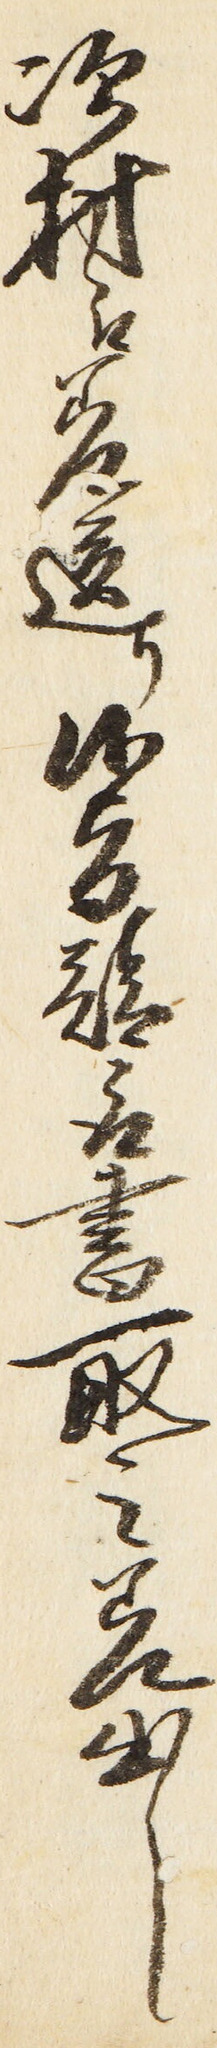次村江差送り候旨請取書取之差出し

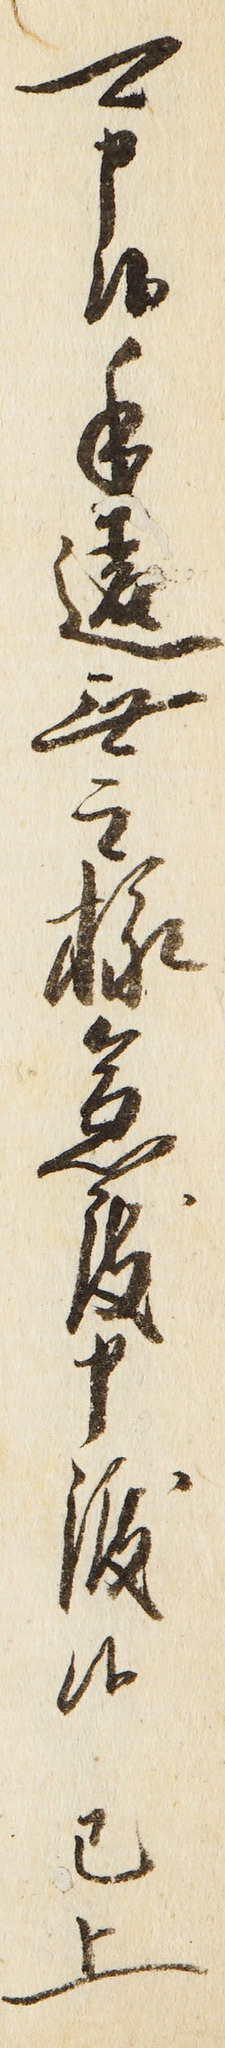可申候手違無之様急度申渡候已上
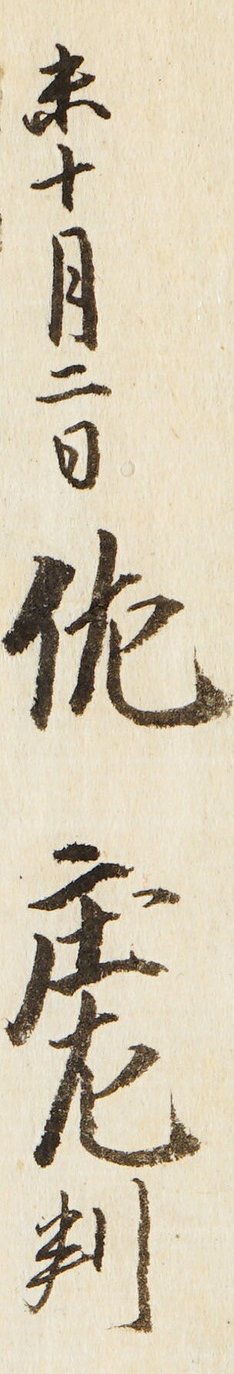未十月二日佐庄左判
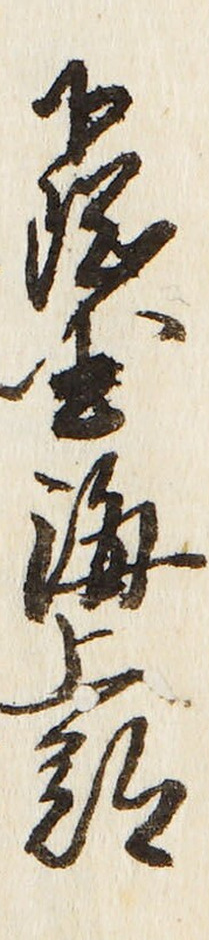下総国海上郡
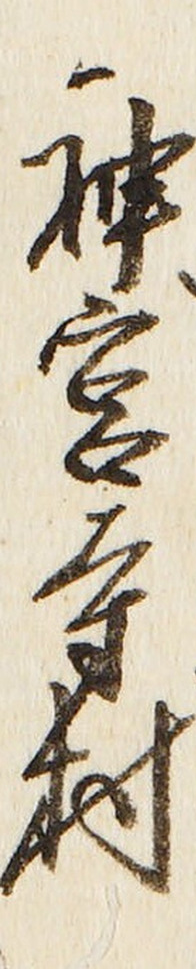神宮寺村
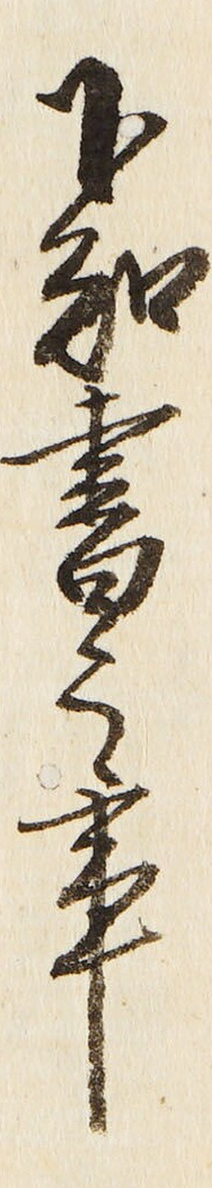下知書之事
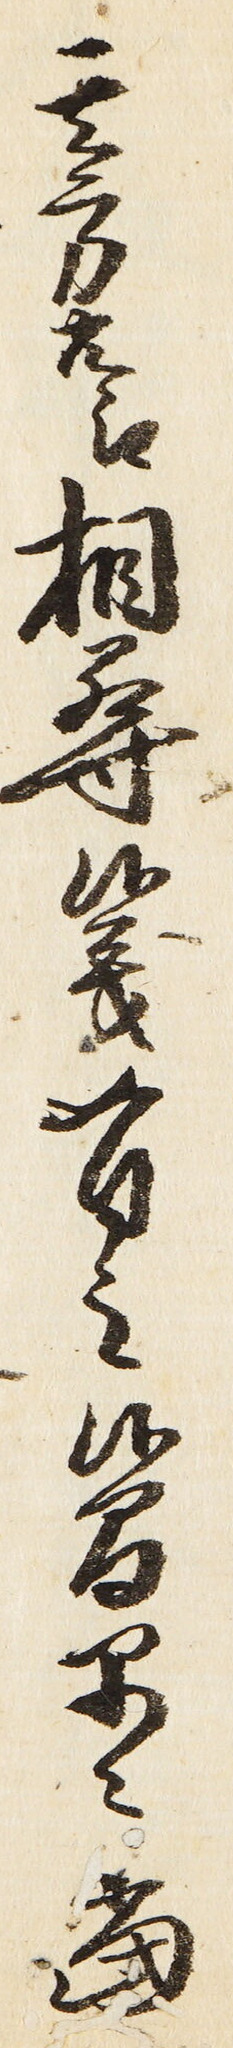其方共江相尋候義有之候間早々当
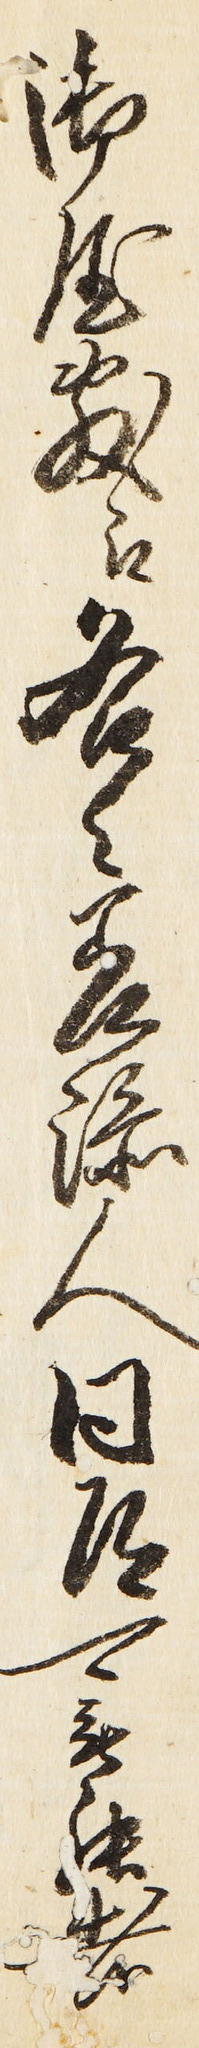御屋敷江各々差添人同道可被罷出候
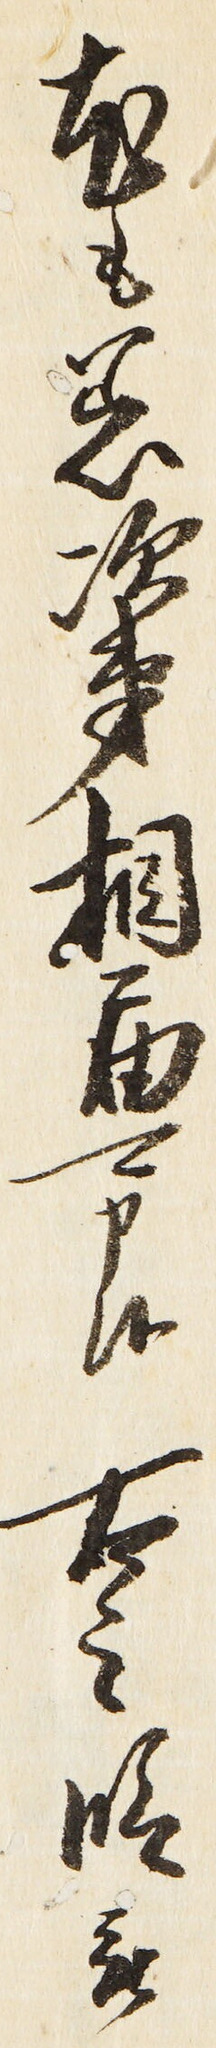尤も着次第相届可申候右之段被
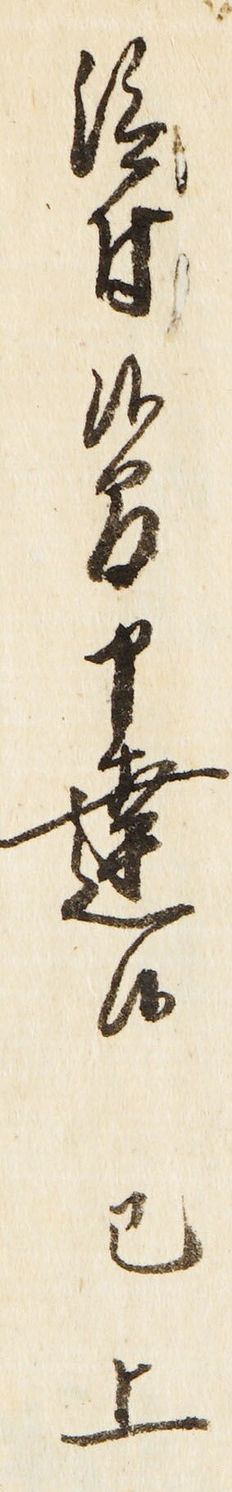仰付候間申達候已上
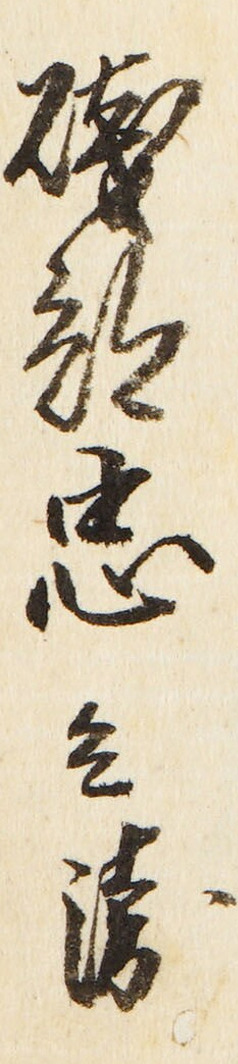磯部忠兵衛

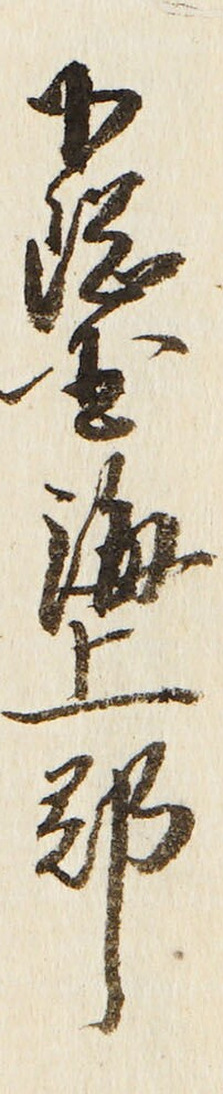下総国海上郡
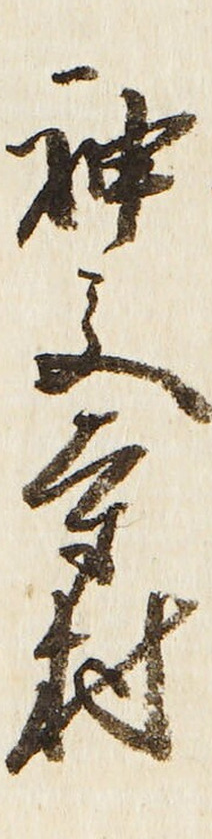神宮寺村
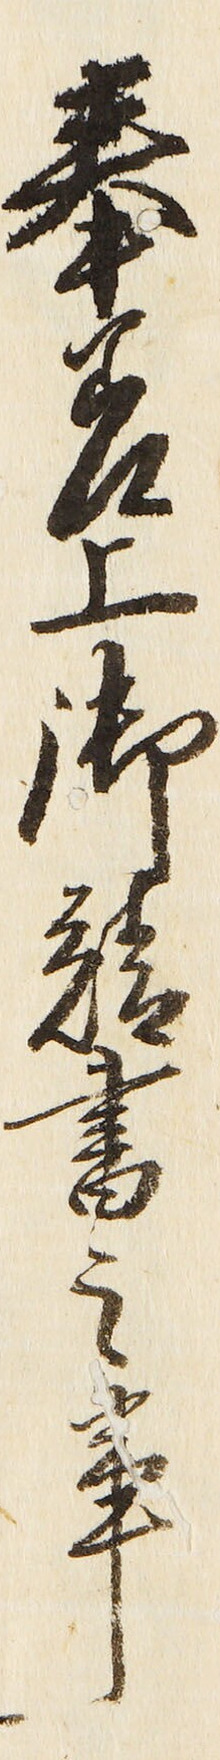奉差上御請書之事
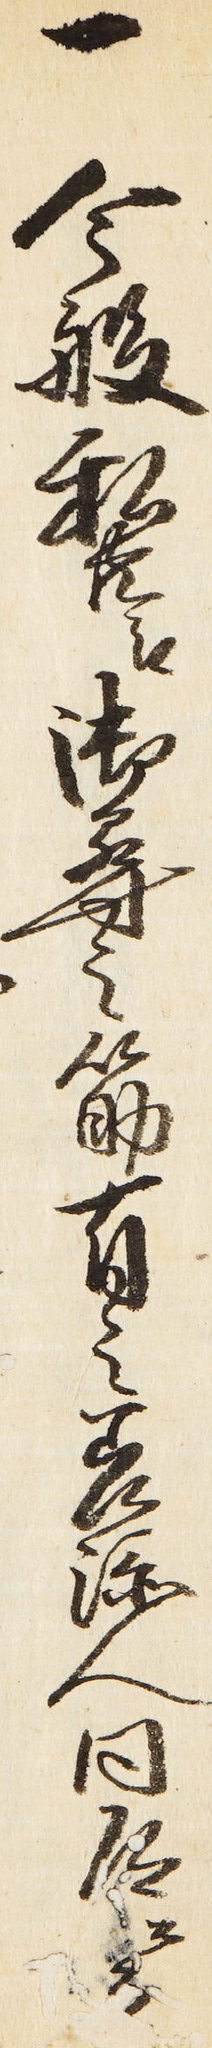一今般私共江御尋之筋有之差添人同道ニ而
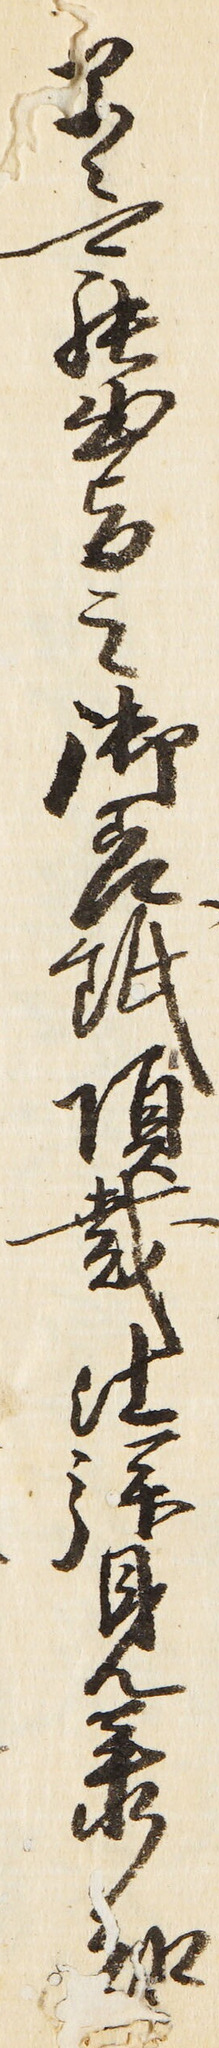早々可罷出旨之御差紙頂戴仕拝見承知
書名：難船一件記録
